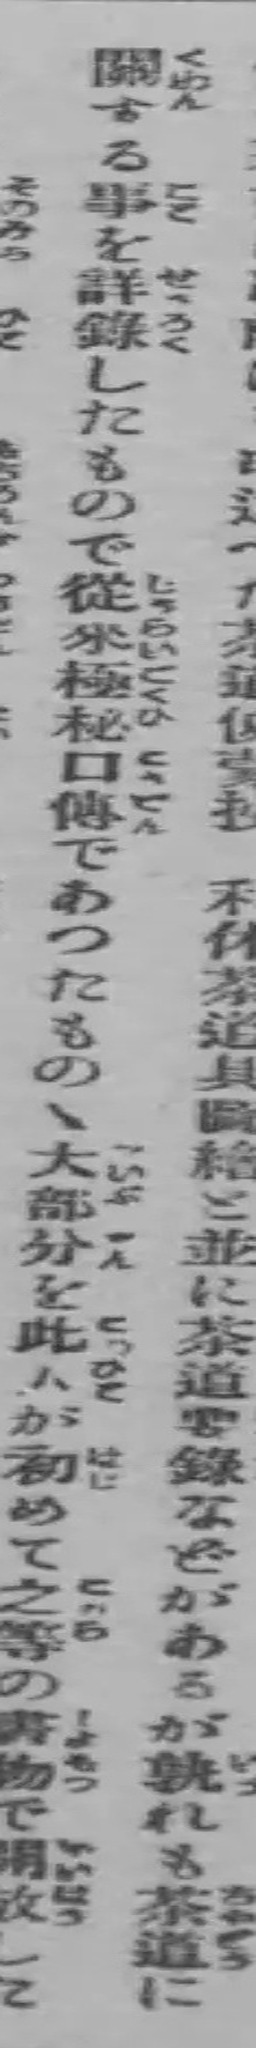関する事を詳録したもので従来極秘口伝であつたものゝ大部分を此人が初めて之等の書物で開放した
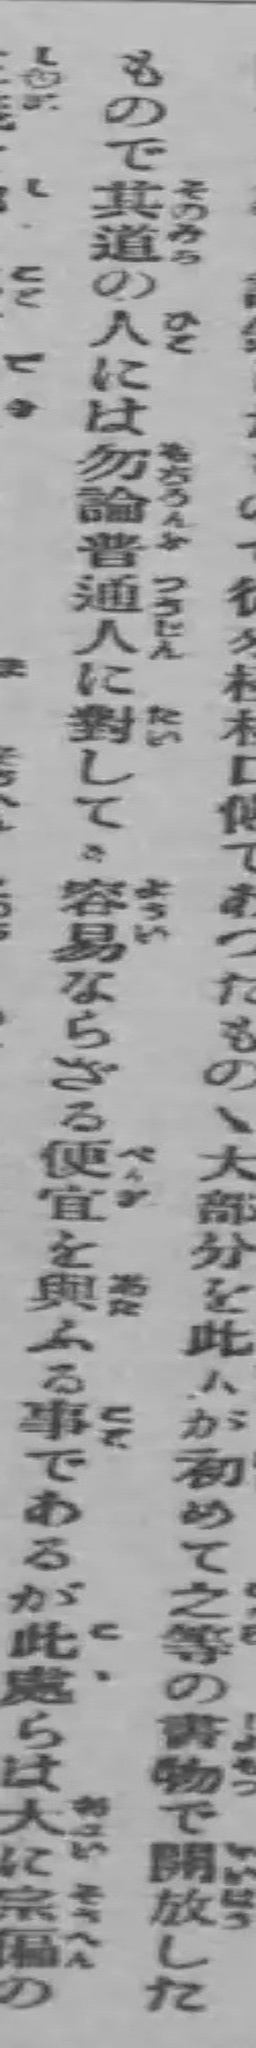もので其道の人には勿論普通人に対しても容易ならざる便宜を与ふる事であるが此処らは大に宗偏の
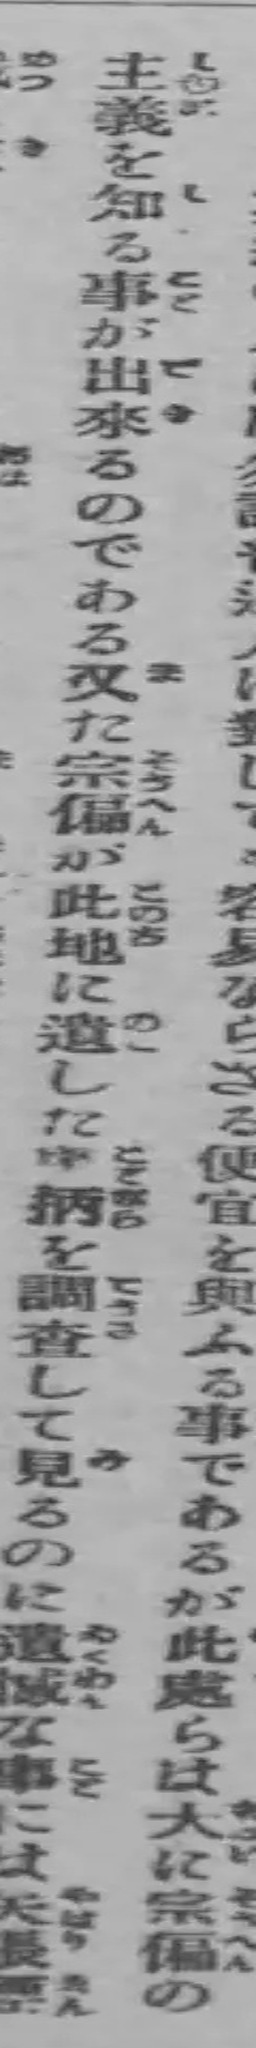主義を知る事が出来るのである又た宗偏が此地に遺した事柄を調査して見るのに遺憾な事には矢張湮
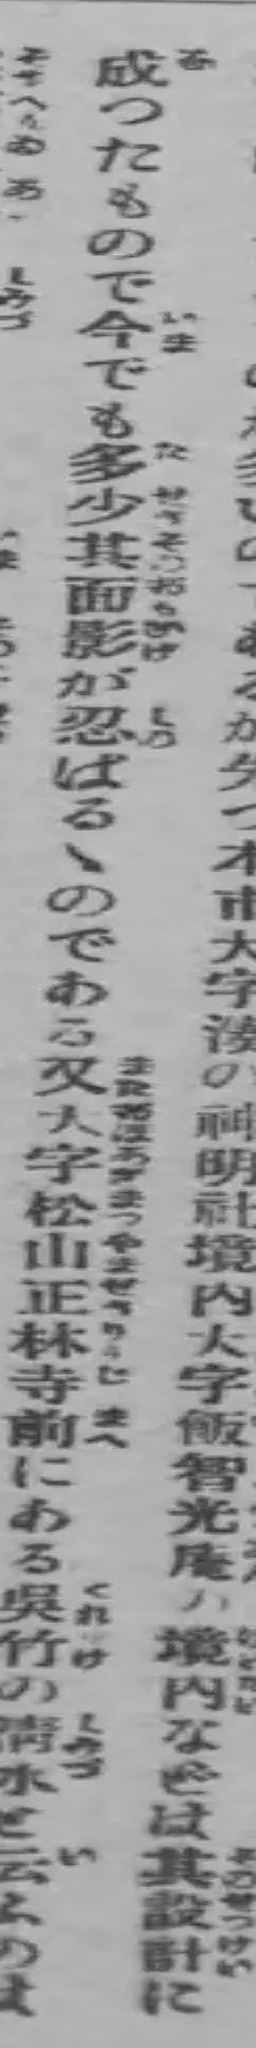呉竹の清水成つたもので今でも多少其面影が忍ばるゝのである又大字松山正林寺前にある呉竹の清水と云ふのは
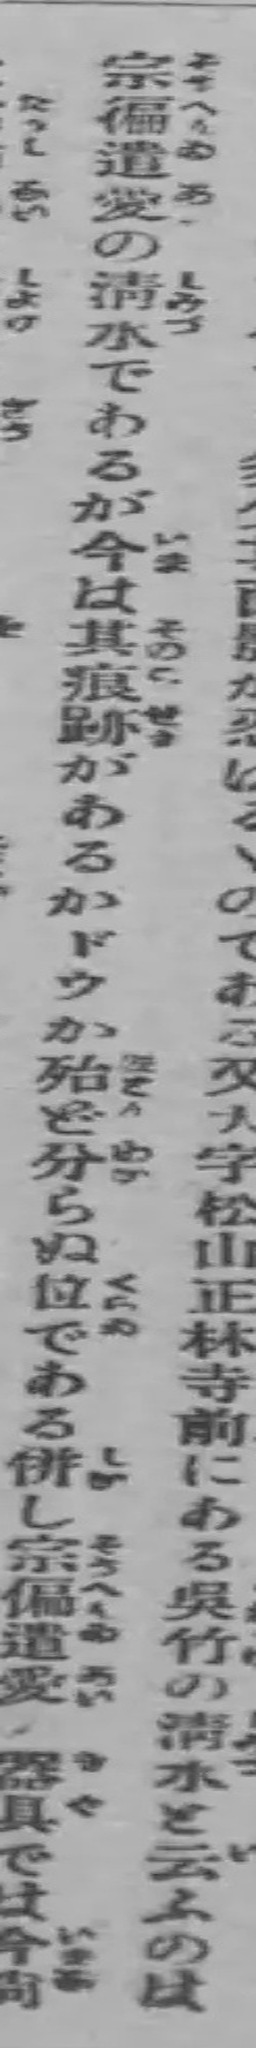宗徧遺愛の清水であるが今は其痕跡があるかドウか殆ど分らぬ位である併し宗偏遺愛の器具では今尚
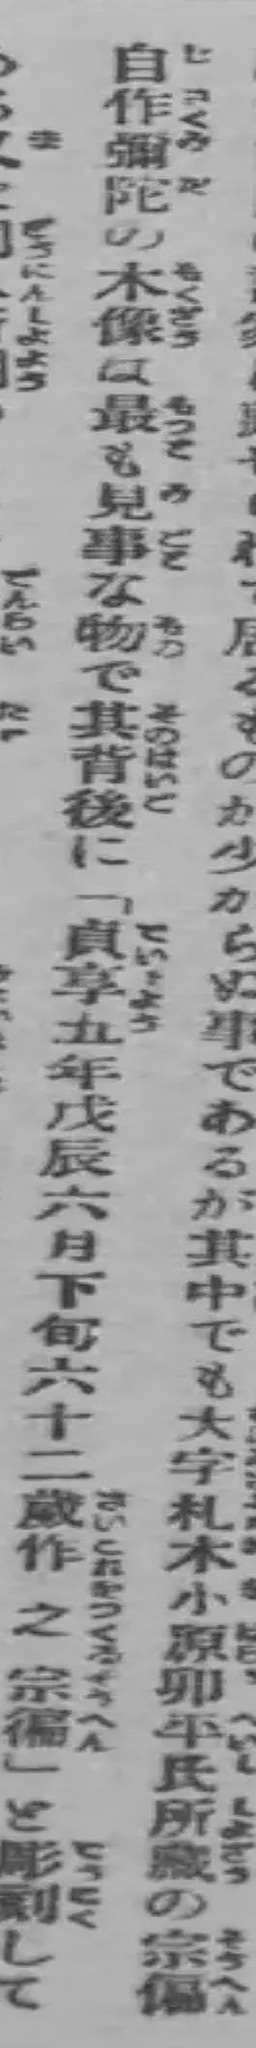自作弥陀の木像は最も見事な物で其背後に「貞享五年戊辰六月下旬六十二歳作之宗徧」と彫刻して
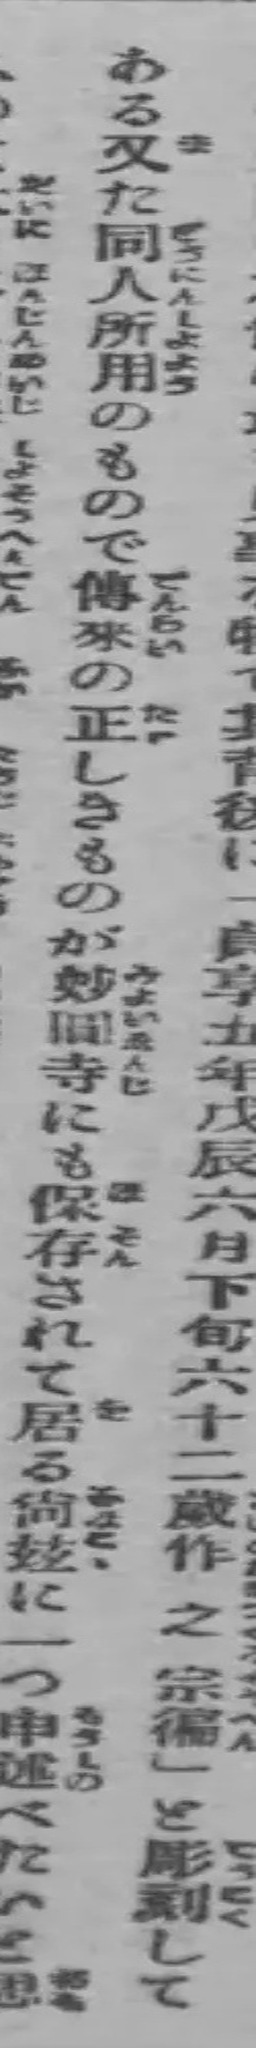ある又た同人所用のもので伝来の正しきものが妙円寺にも保存されて居る尚茲に一つ申述べたいと思
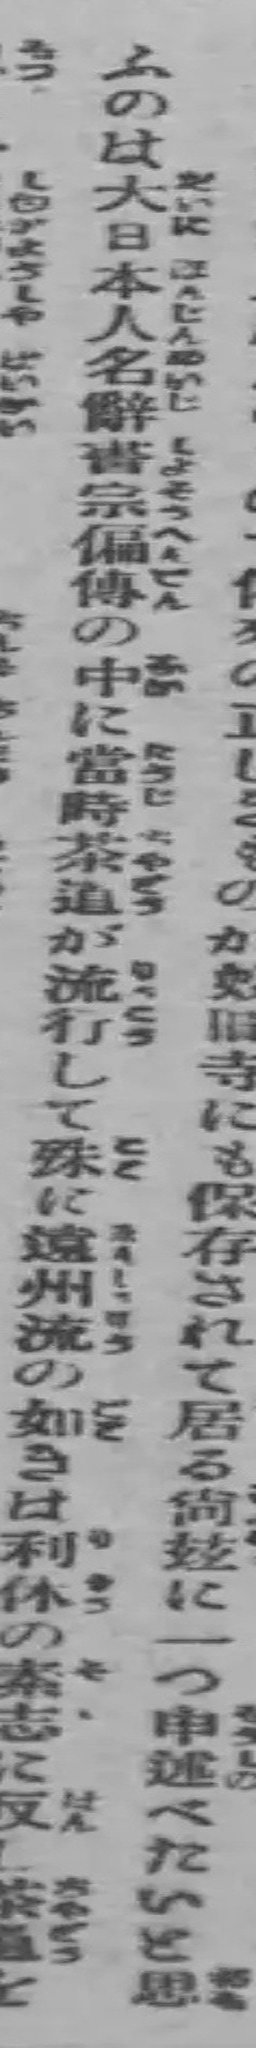ふのは大日本人名辞書宗偏伝の中に当時茶道が流行して殊に遠州流の如きは利休の素志に反し茶道を
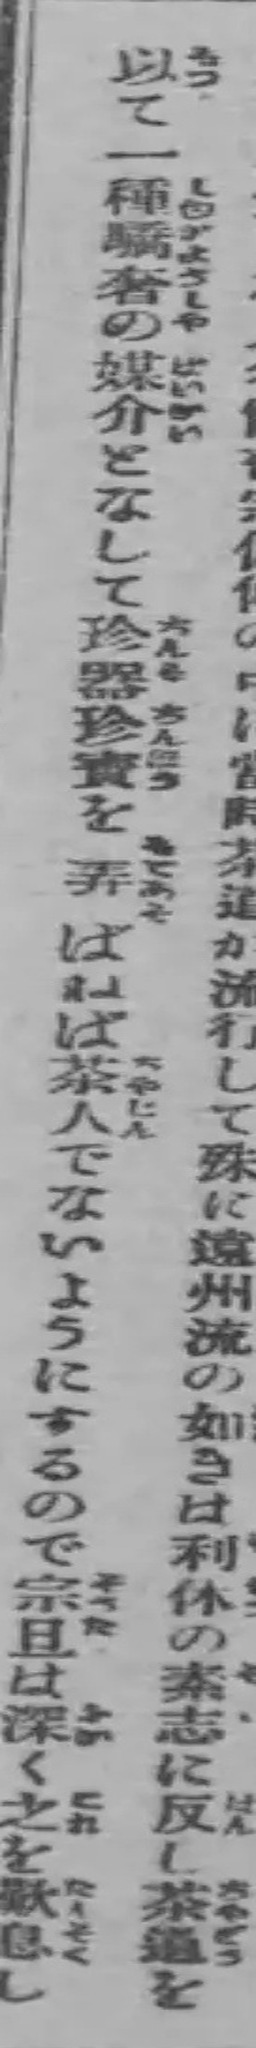以て一種驕奢の媒介となして珍器珍宝を弄ばねば茶人でないようにするので宗旦は深く之を歎息し
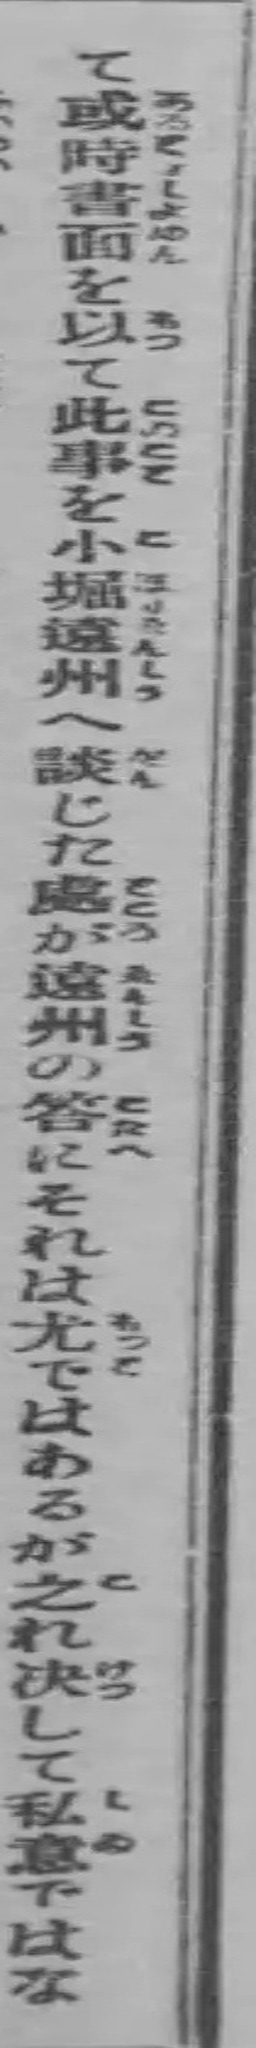て或時書面を以て此事を小堀遠州へ談じた処が遠州の答にそれは尤ではあるが之れ決して私意ではな
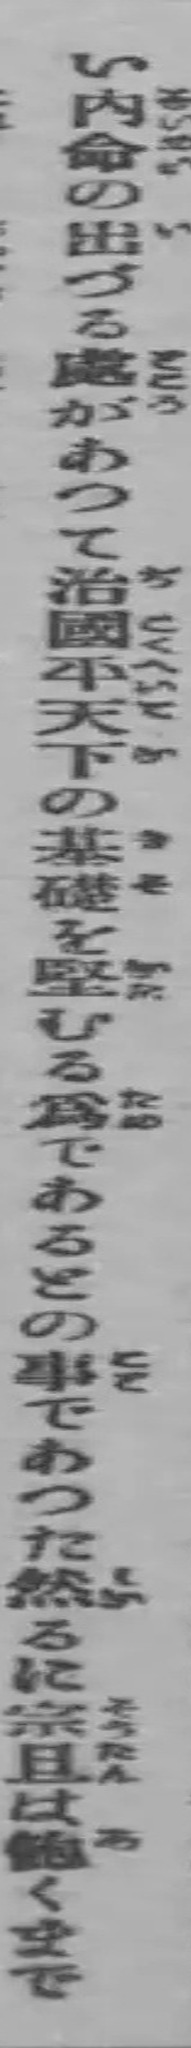い内命の出づる処があつて治国平天下の基礎を堅むる為であるとの事であつた然るに宗旦は飽くまで
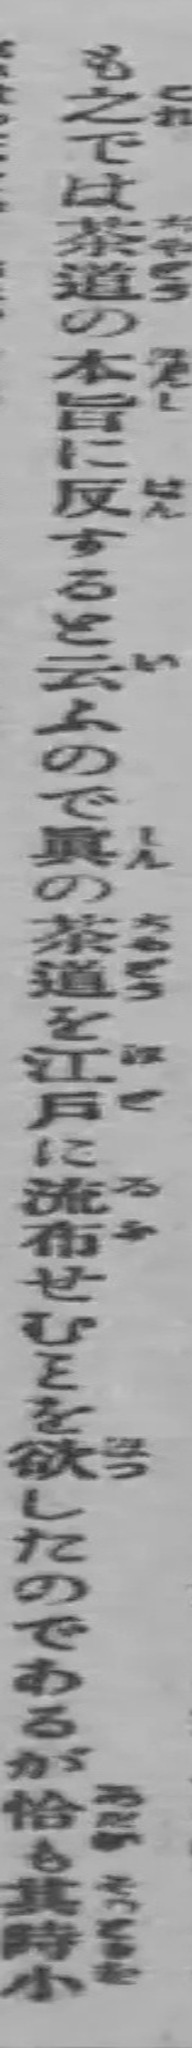も之では茶道の本旨に反すると云ふので真の茶道を江戸に流布せむことを欲したのであるが恰も其時小
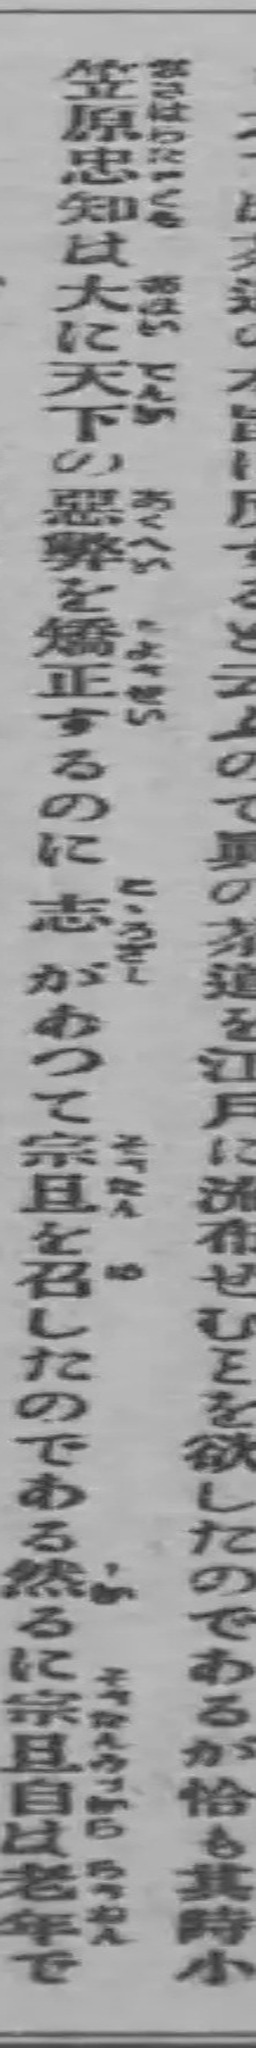宗偏と忠知笠原忠知は大に天下の悪弊を矯正するのに志があつて宗旦を召したのである然るに宗旦自は老年で
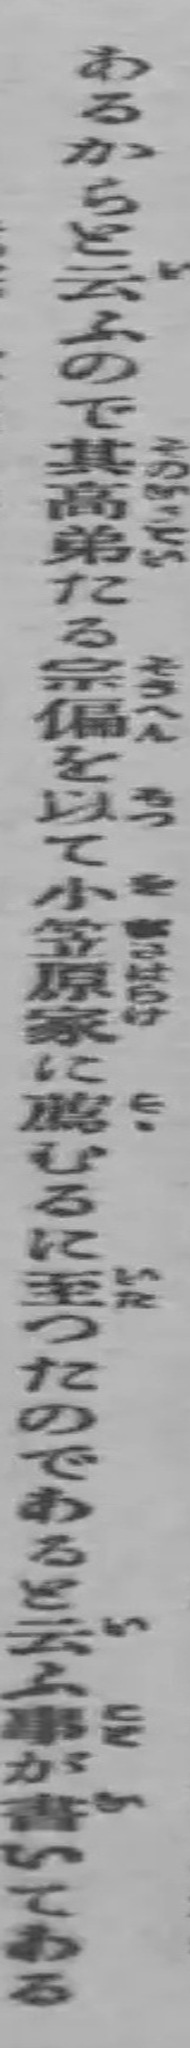あるからと云ふので其高弟たる宗偏を以て小笠原家に薦むるに至つたのであると云ふ事が書いてある
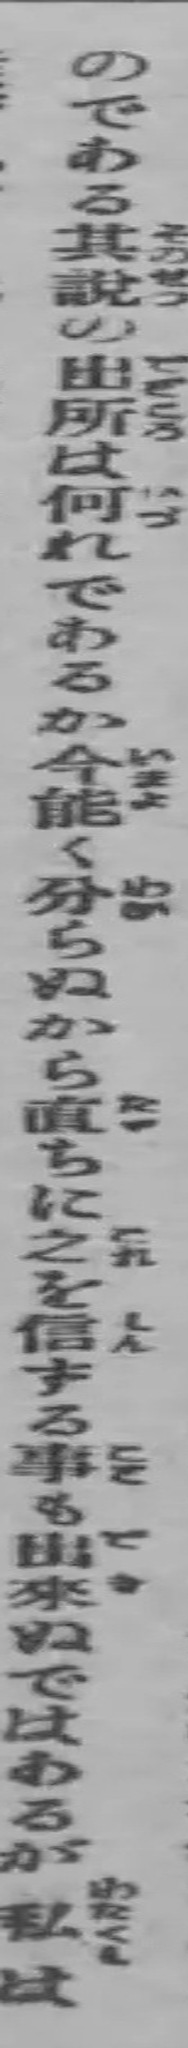のである其説の出所は何れであるか今能く分らぬから直ちに之を信ずる事も出来ぬではあるが私は
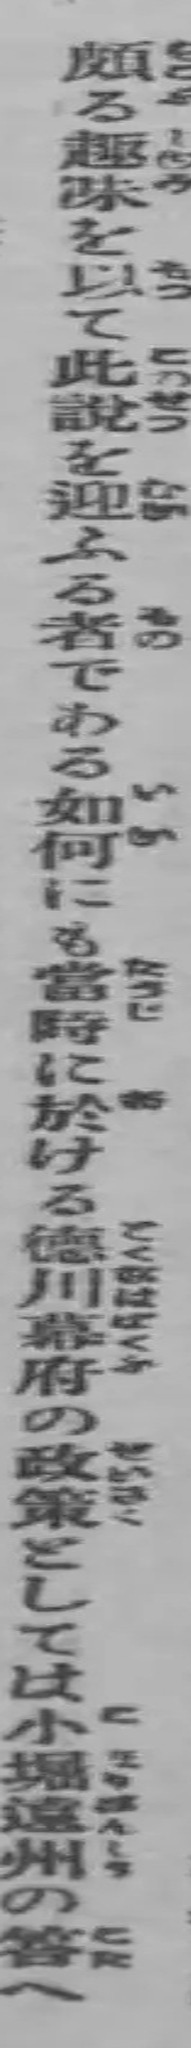頗る趣味を以て此説を迎ふる者である如何にも当時に於ける徳川幕府の政策としては小堀遠州の答へ
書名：豊橋市史談
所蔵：国立国会図書館 National Diet Library, JAPAN
